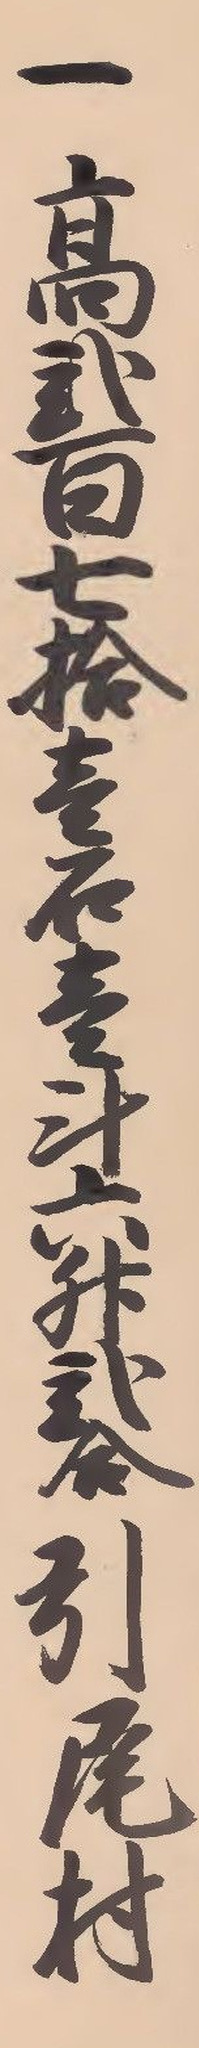一高弐百七拾壱石壱斗六升弐合引尾村
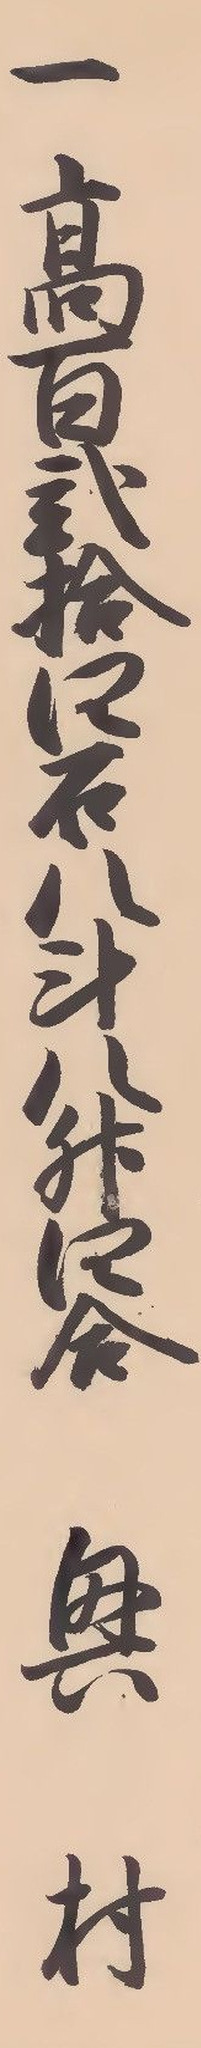一高百弐拾四石八斗八升四合奥村
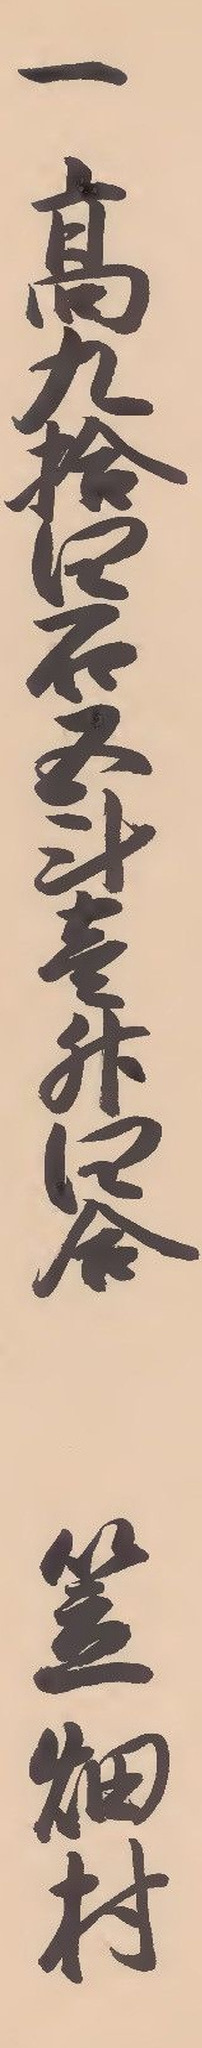一高九拾四石五斗壱升四合笠畑村
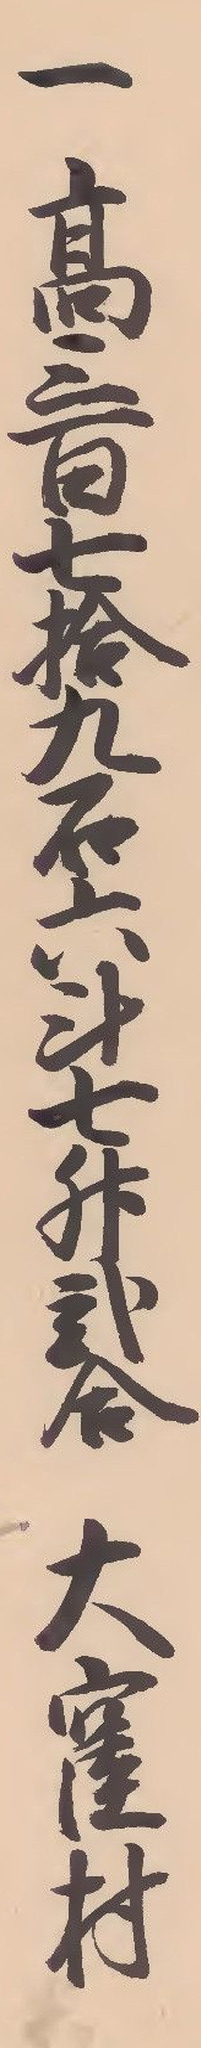一高三百七拾九石六斗七升弐合大窪村

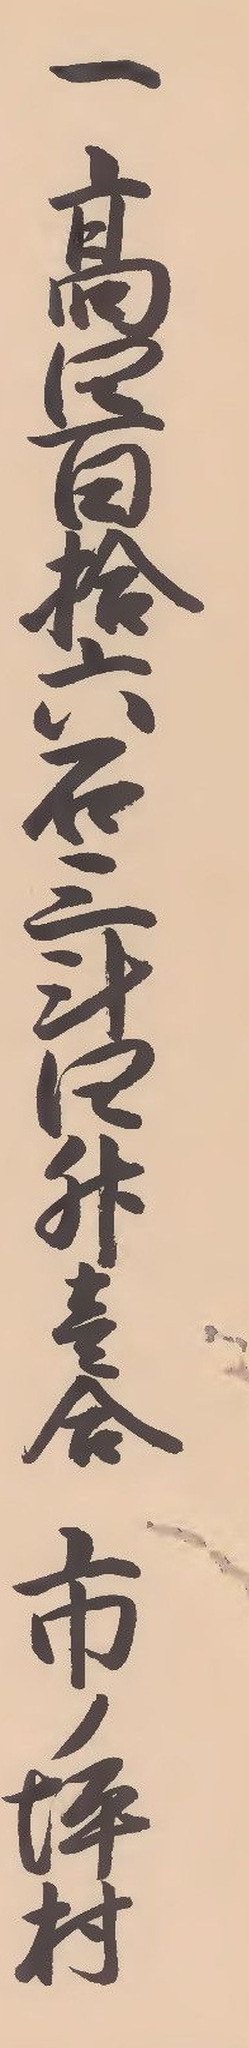一高四百拾六石三斗四升壱合市ノ坪村
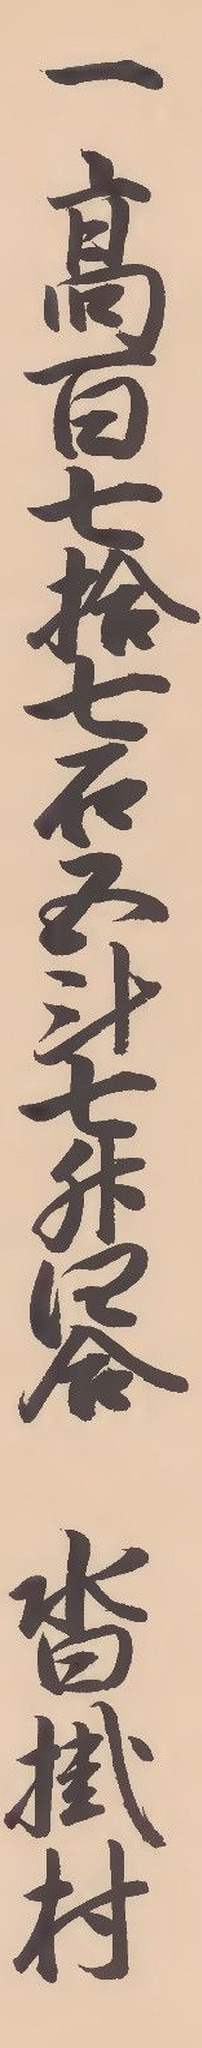一高百七拾七石五斗七升四合沓掛村
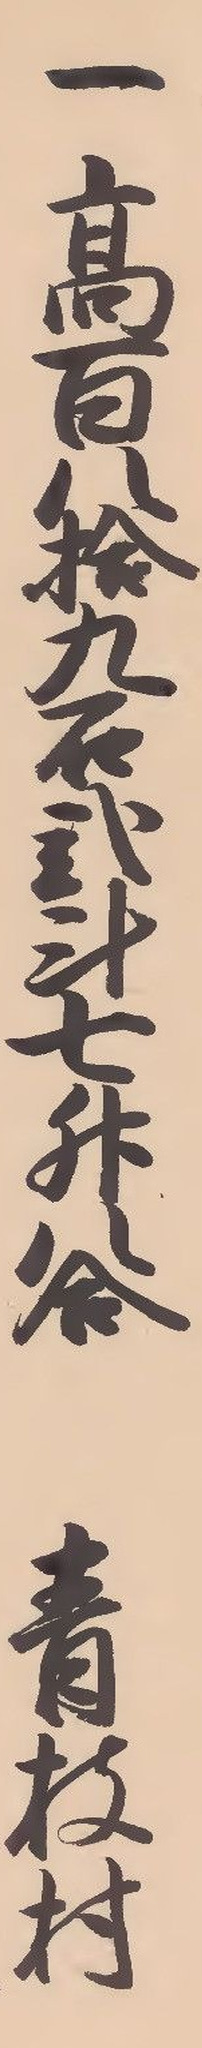一高百八拾九石弐斗七升八合青枝村
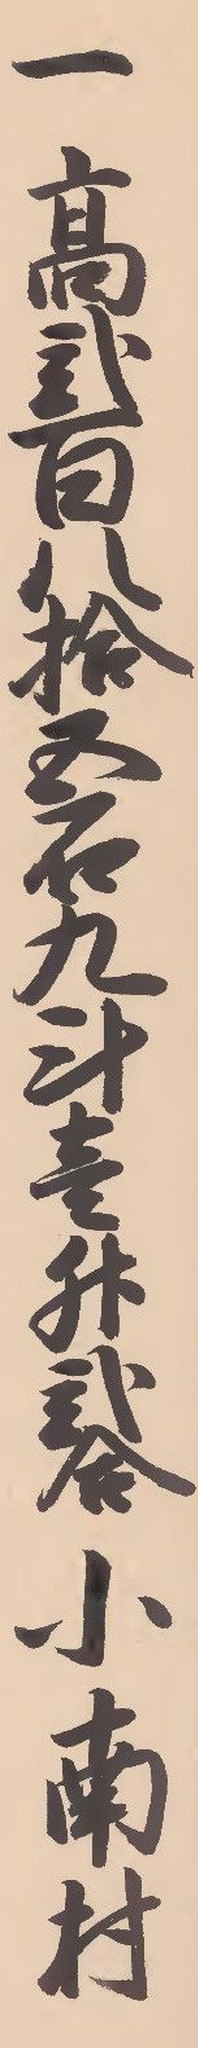一高弐百八拾五石九斗壱升弐合小南村
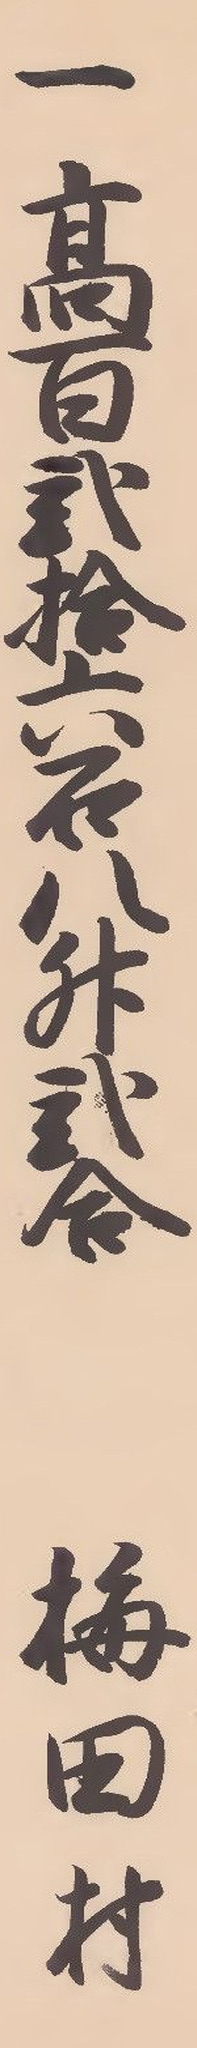一高百弐拾六石八升弐合梅田村
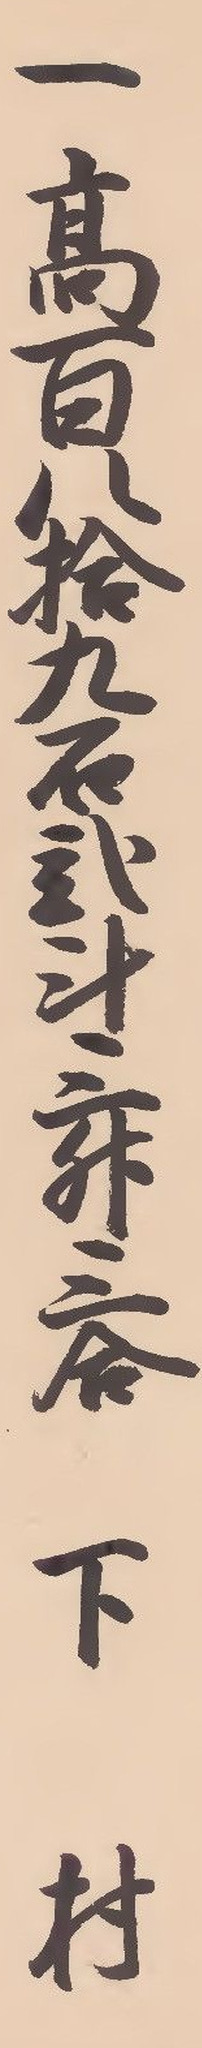一高百八拾九石弐斗三升三合下村
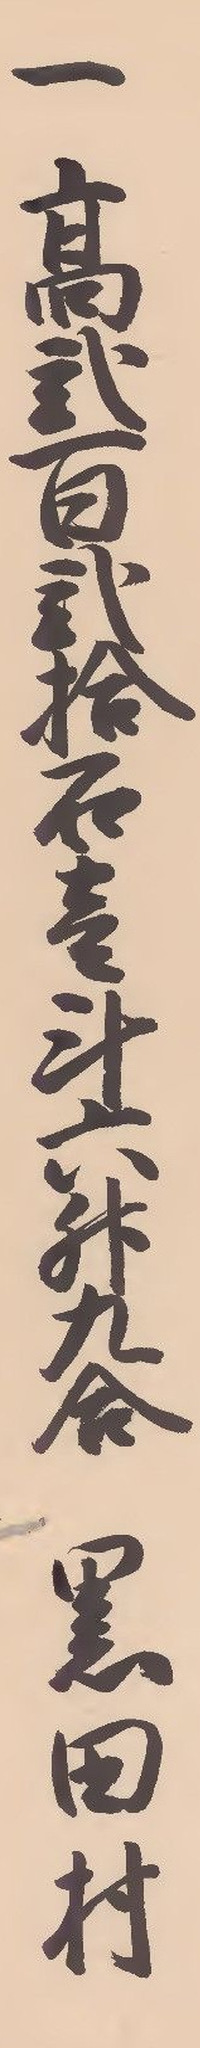一高弐百弐拾石壱斗六升九合黒田村

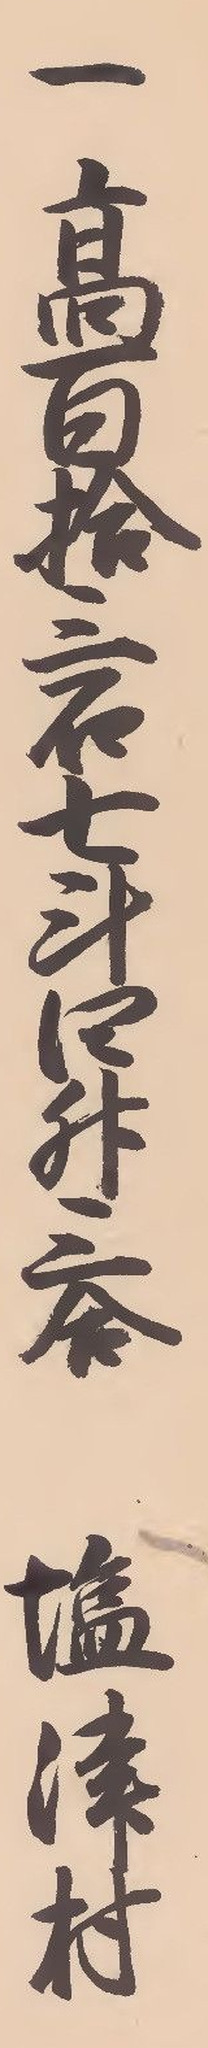一高百拾三石七斗四升三合塩津村
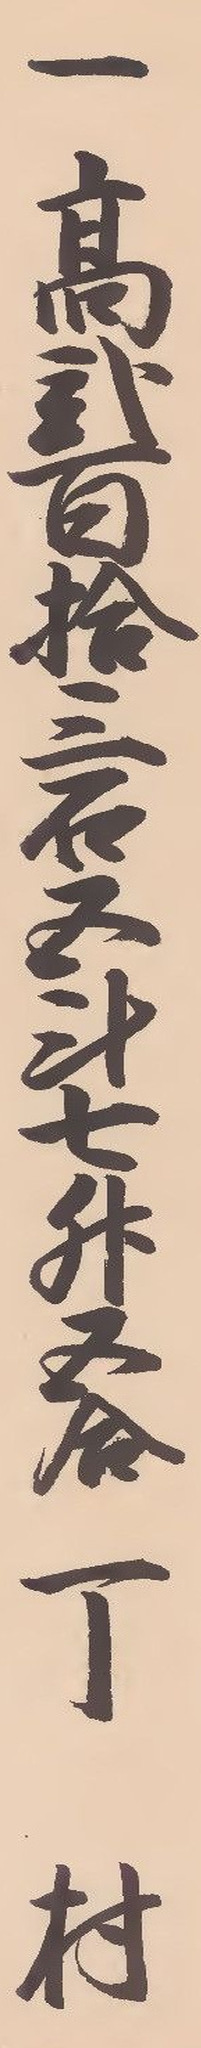一高弐百拾三石五斗七升五合丁村
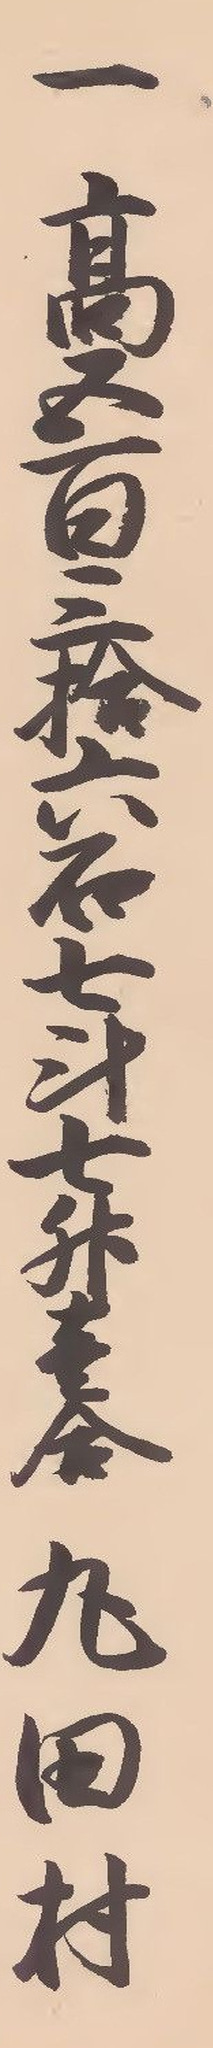一高五百三拾六石七斗七升壱合丸田村
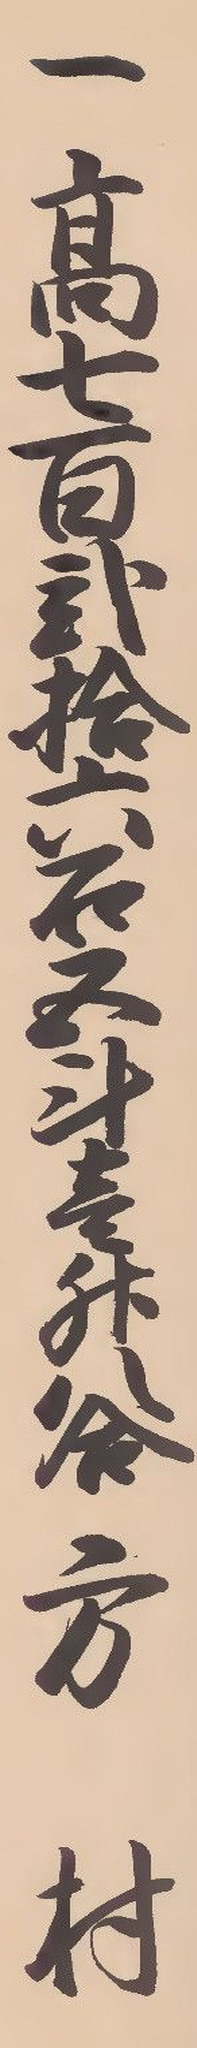一高七百弐拾六石五斗壱升八合方村
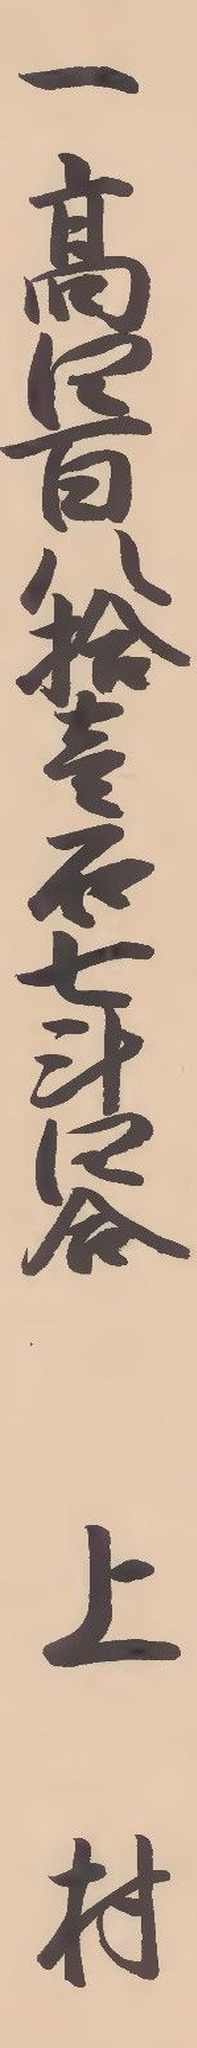一高四百八拾壱石七斗四合上村
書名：紀伊国郷帳
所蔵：国立公文書館 National Archives of Japan
